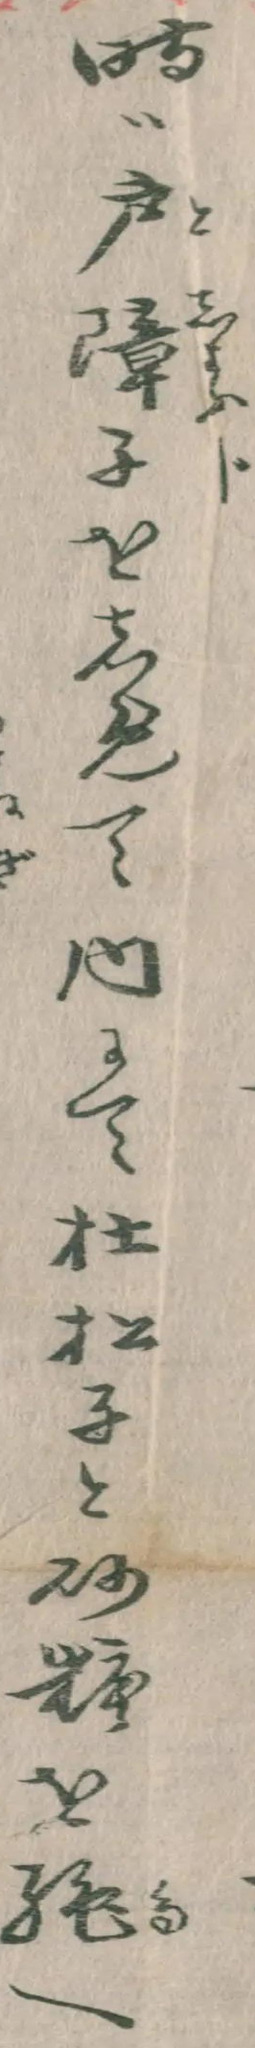時は戸障子をしめて内にて杜松子と砂糖を然也
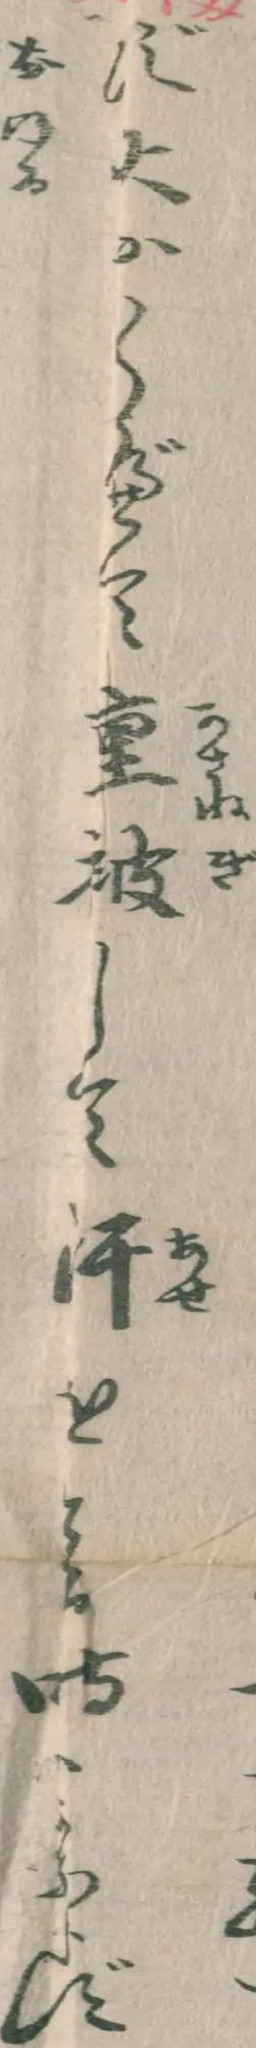ず▢▢▢べて重被して汗を▢▢時はかならず
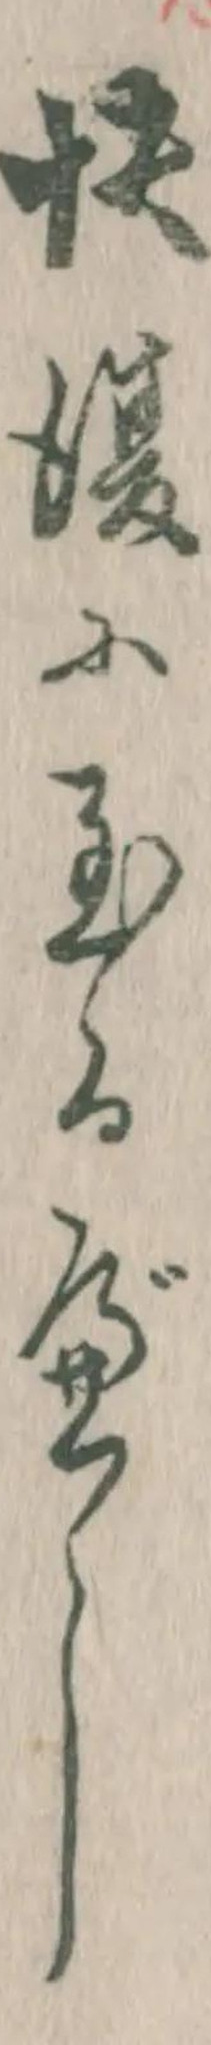快復に至るべし
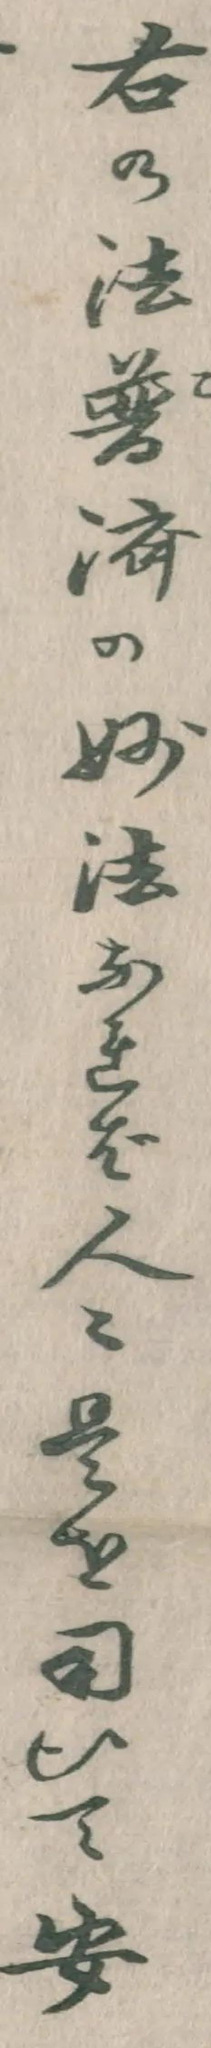右の法普済の妙法なれば人々是を用ひて安
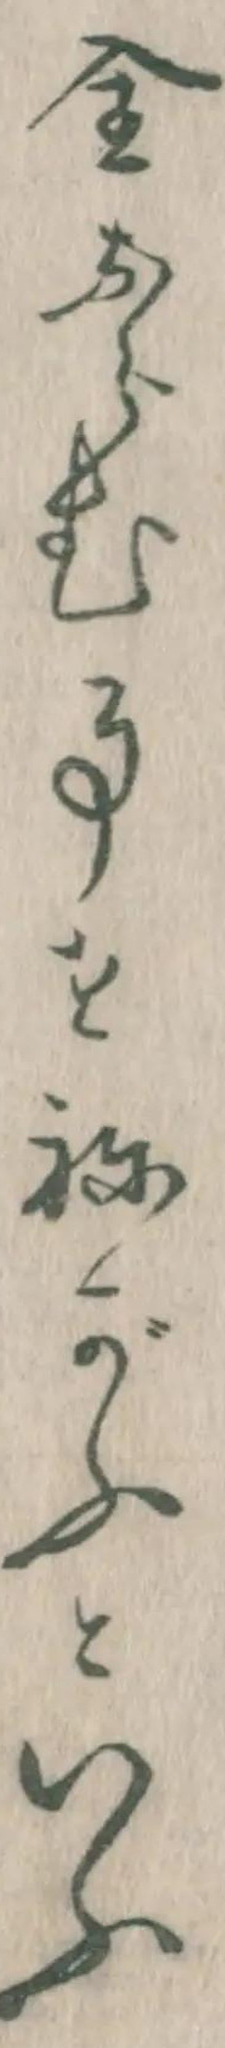全ならむ事をねがふといふ
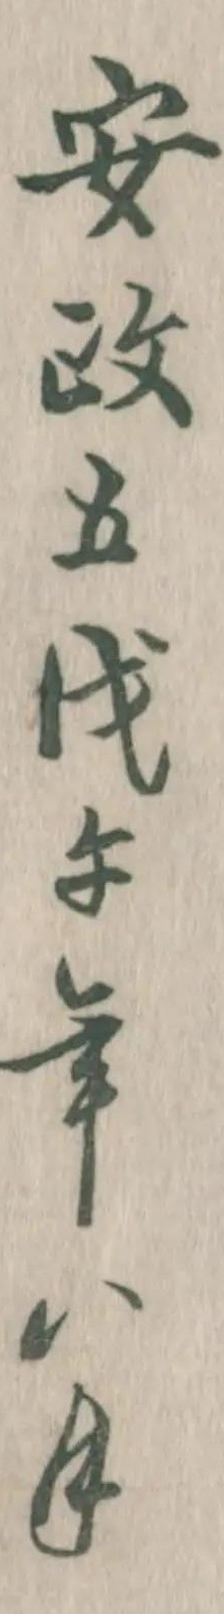安政五戌午年八月
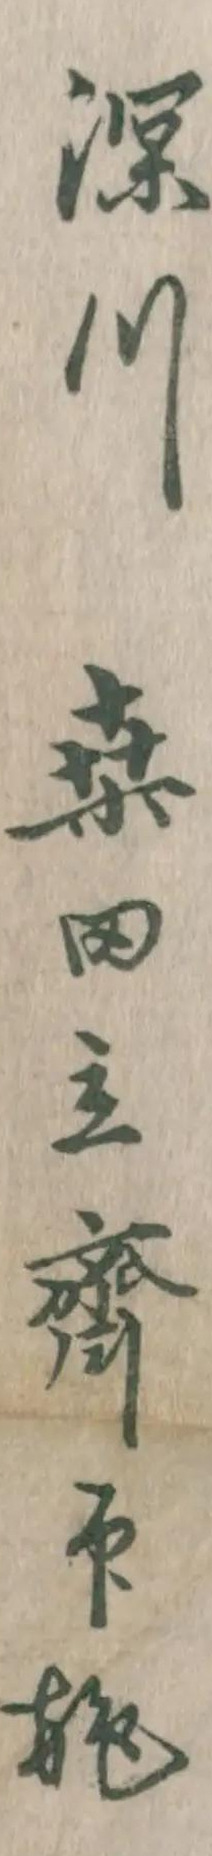深川森田立斉印施
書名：暴瀉病手当素人心得書
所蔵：国立国会図書館 National Diet Library, JAPAN
